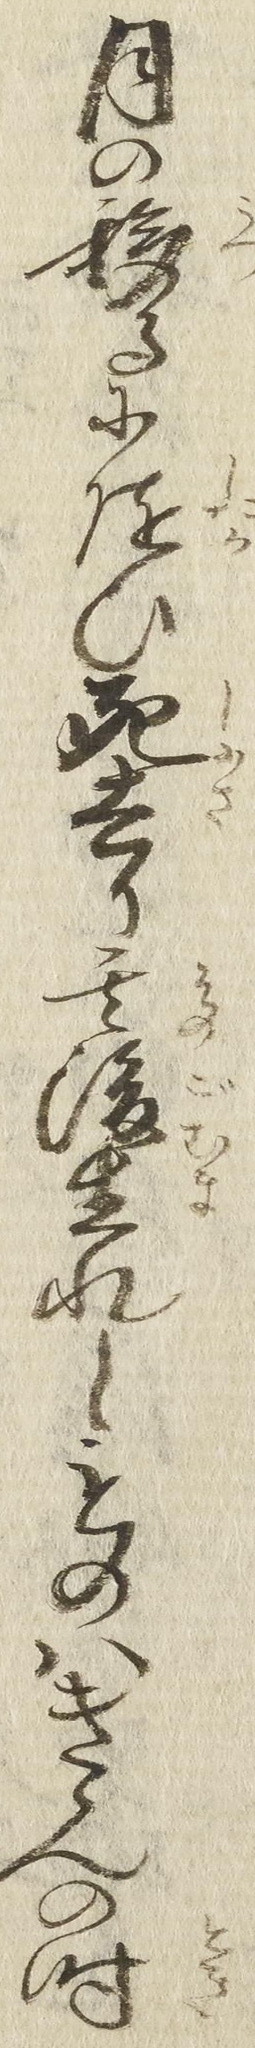月の移るに随ひ死去り其後生れしものはきゝんの時
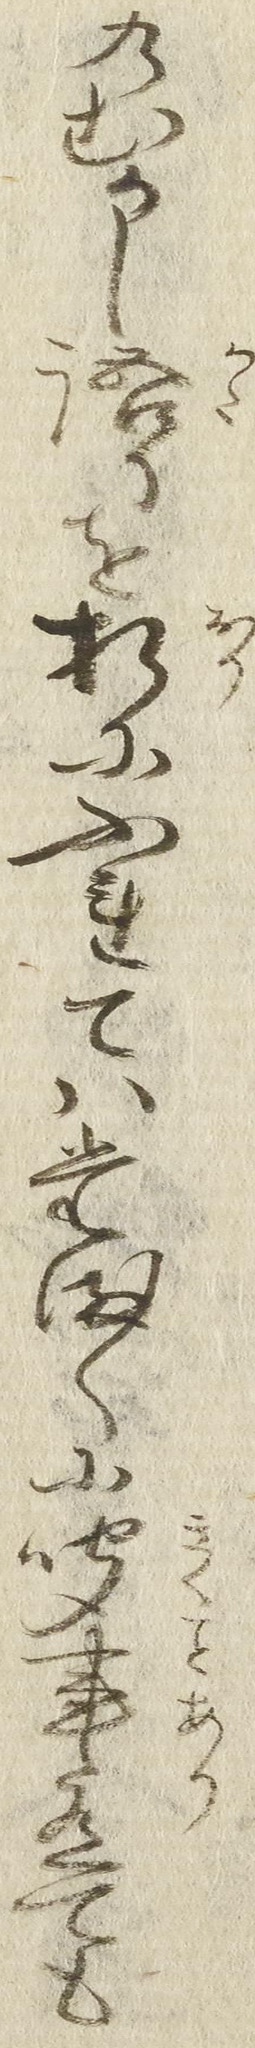のむかし語りを折にふれてはたま〳〵に聞事有ても
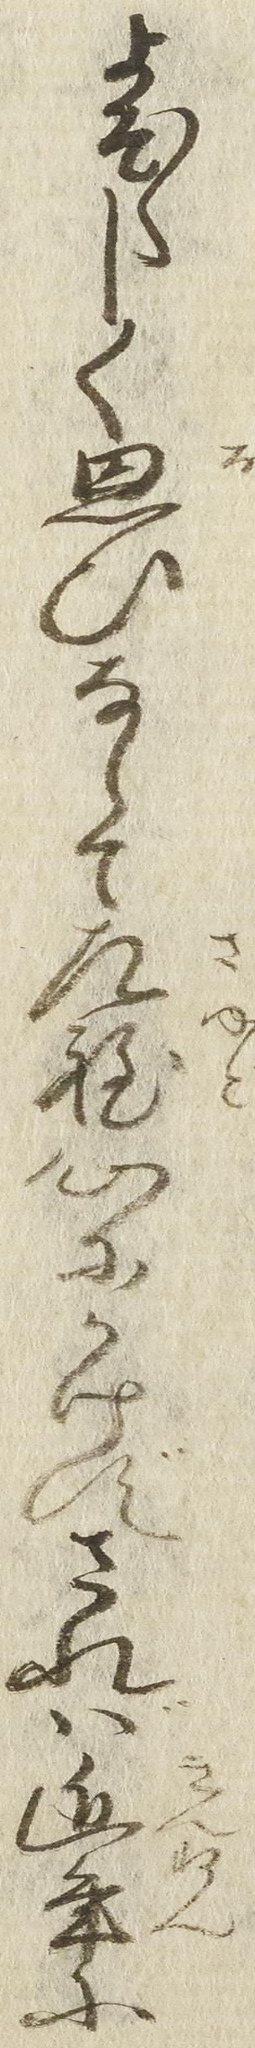よそ〳〵しく思ひなして左程心にかけずされば近年に
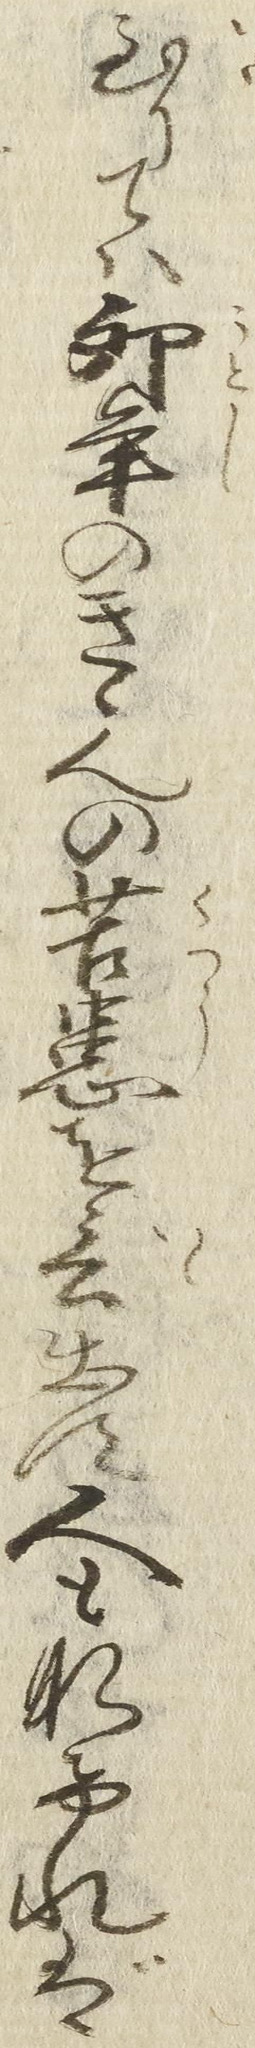至りては卯年のきゝんの苦患を言出す人もなければ
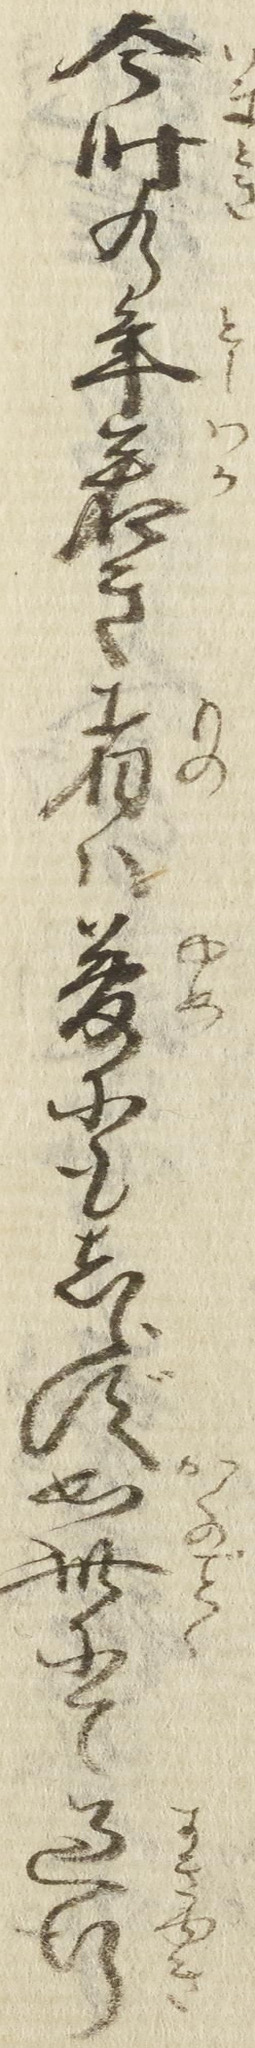今時の年若き者は夢にも知らず如此にて過行
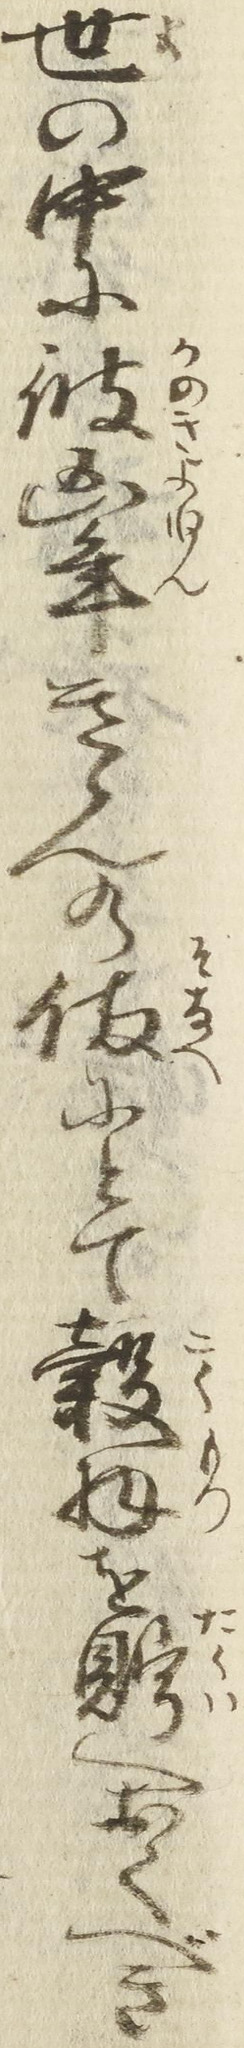世の中に彼凶年きゝんの備にとて穀物を貯へおくべき
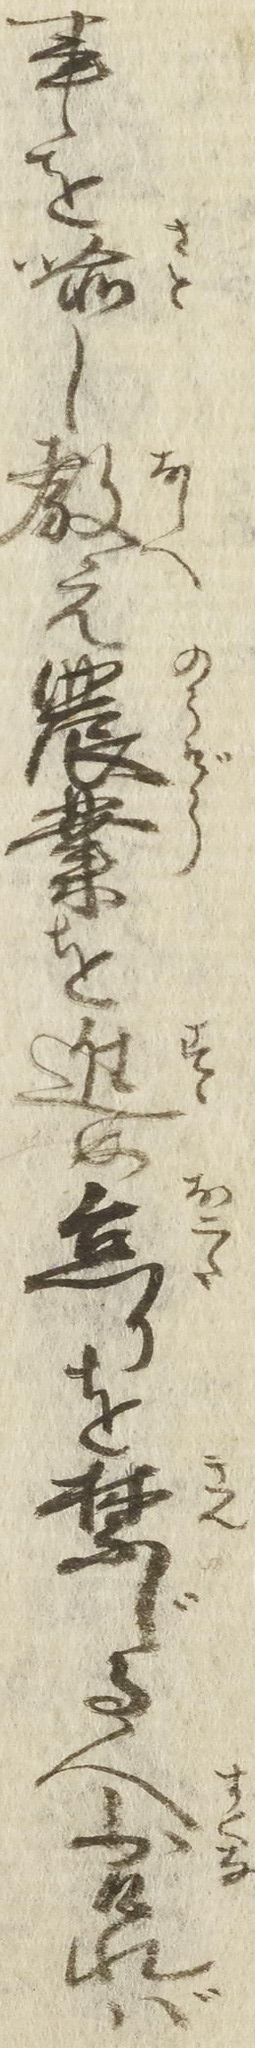事を諭し教え農業を進め怠りを禁じる人少ければ
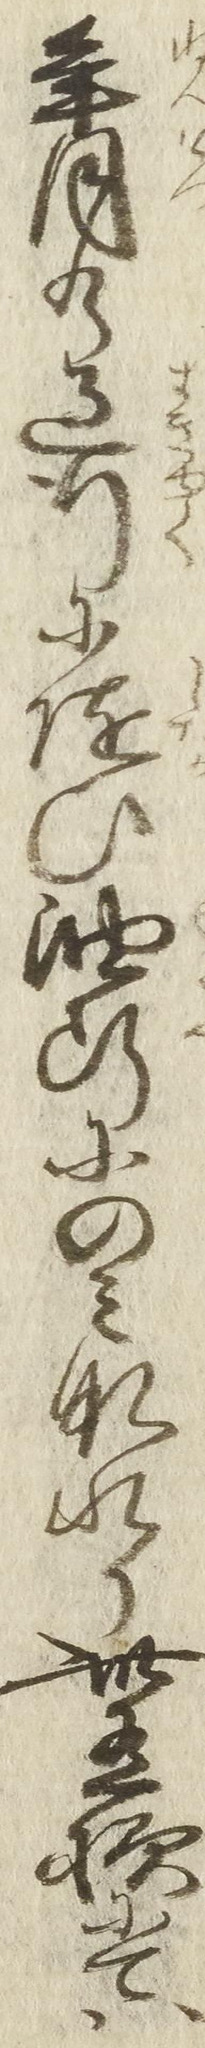年月の過行に随ひ油断にのみなれり此有様にては
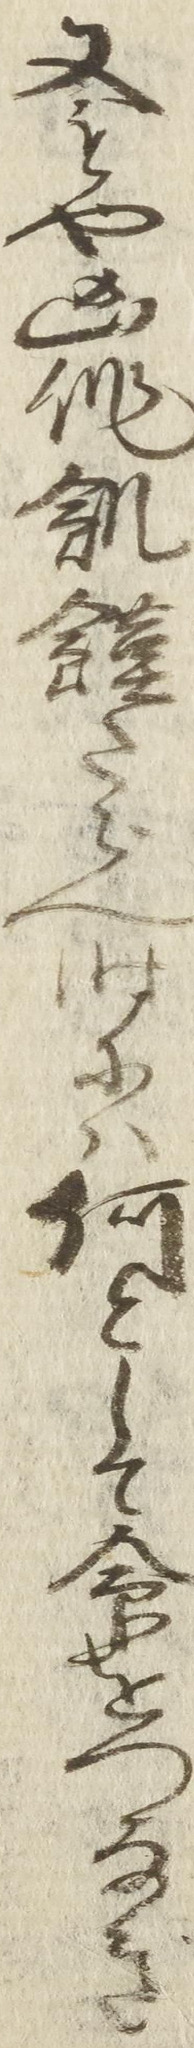又もや凶作飢饉たらん時には何として命をつなぎ
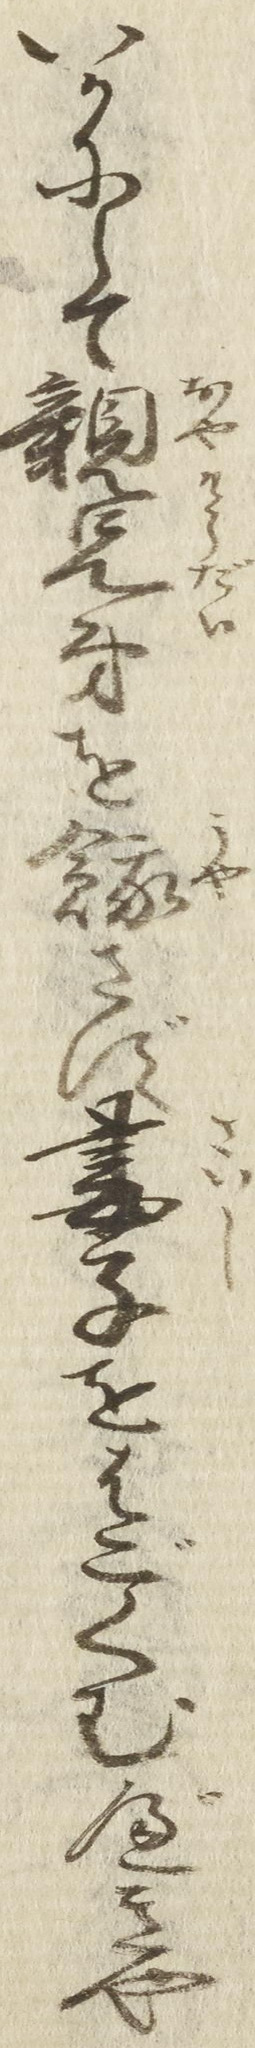いかにして親兄弟を餓さず妻子をはごくむべきや
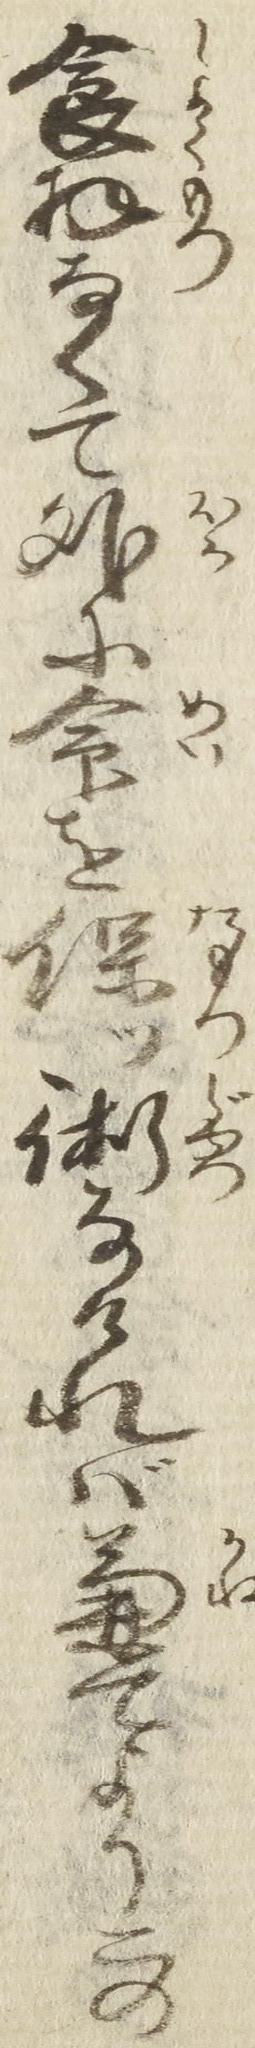食物なくて外に命を保ツ術なければ兼てよりこの
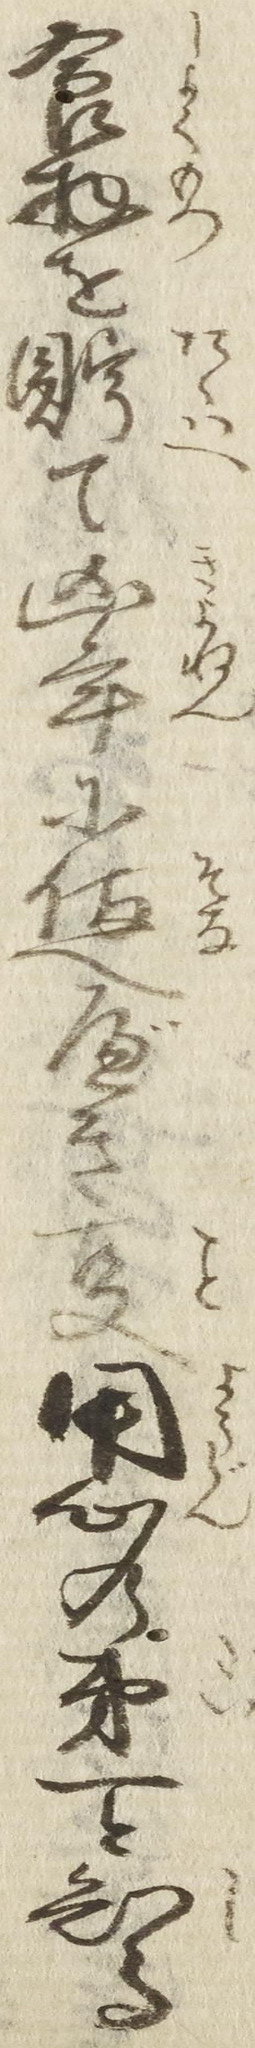食物を貯て凶年に備へべき事用心の第一と知る
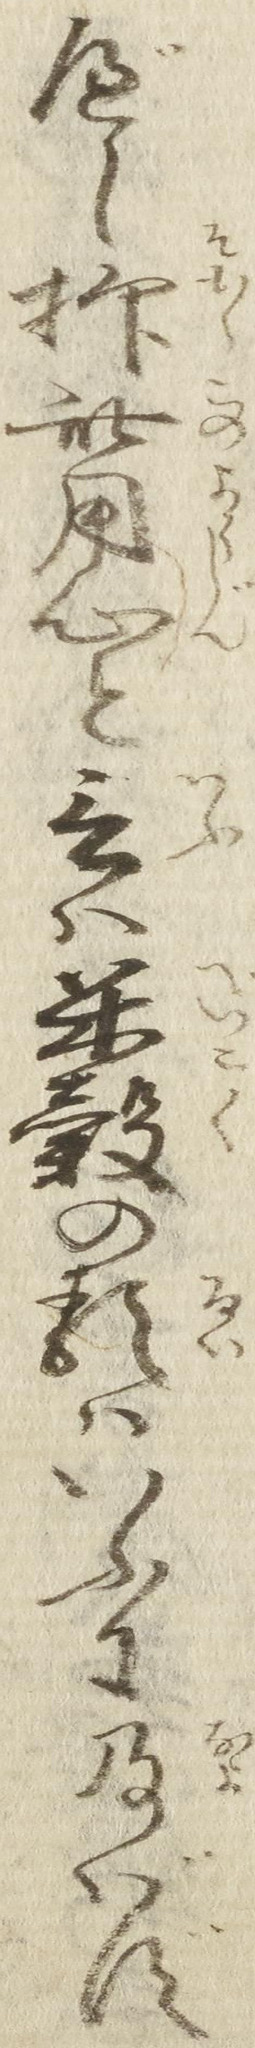べし抑此用心と言は米穀の類はいふに及ばず

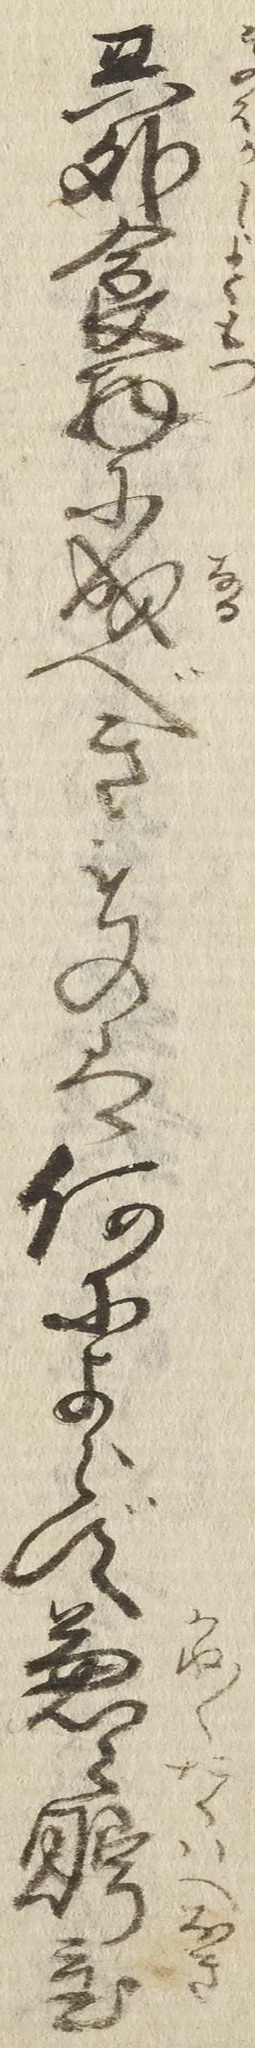其外食物に成べきものは何によらず兼〻貯置
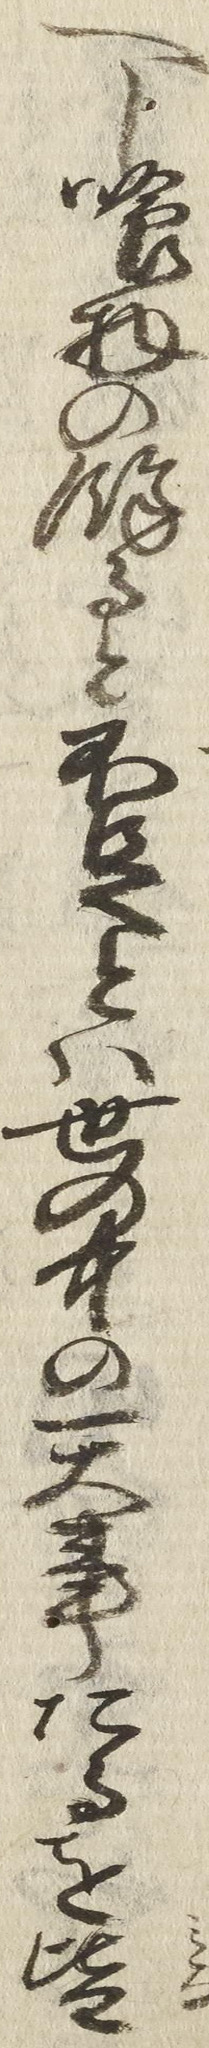へし食物の余ると不足とは世の中の一大事たるを皆
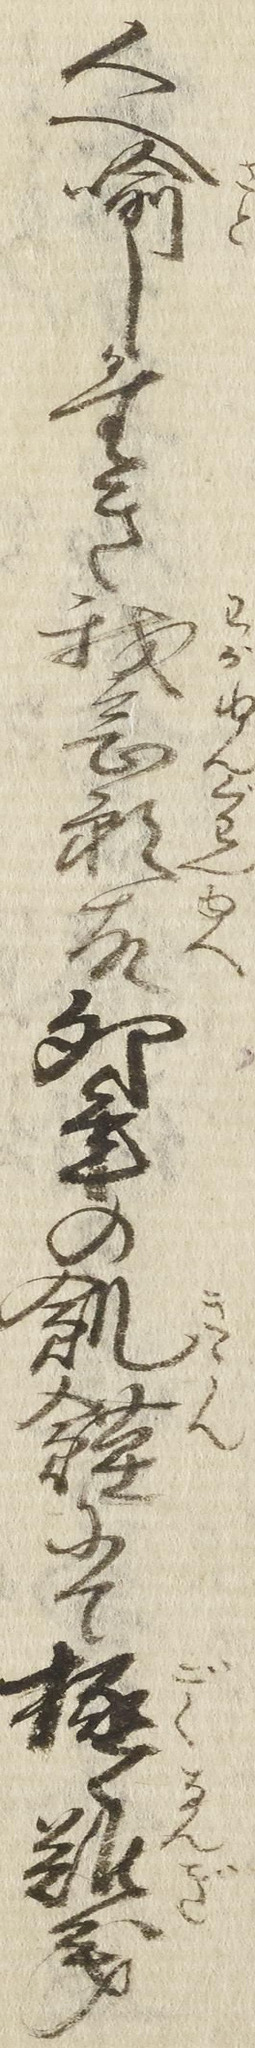人へ諭したき我念願故卯年の飢饉にて極〻難義
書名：天明奇畧　全
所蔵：東京大学地震研究所図書室 Earthquake Research Institute Library, The University of Tokyo, JAPAN
